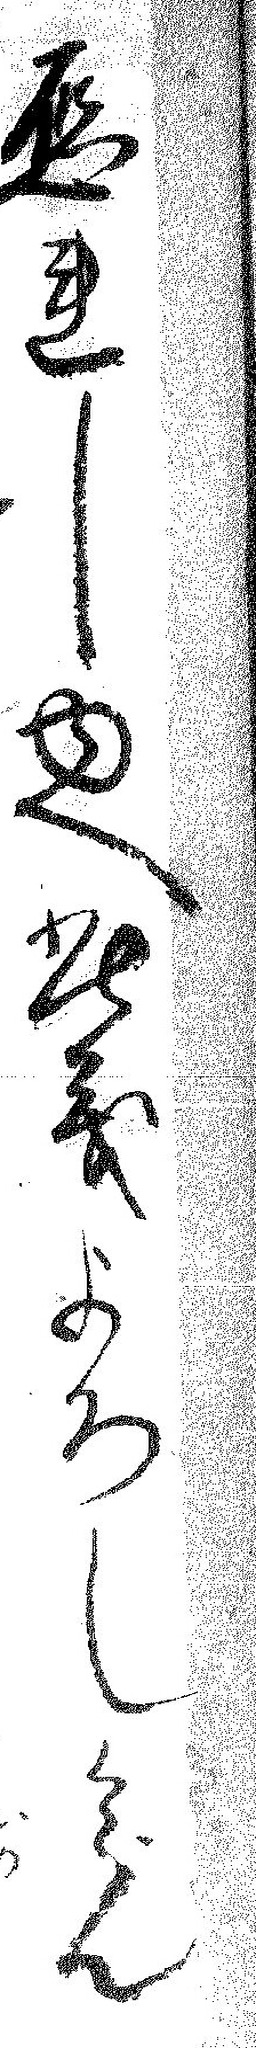恐れしゆへ此義よろしからん
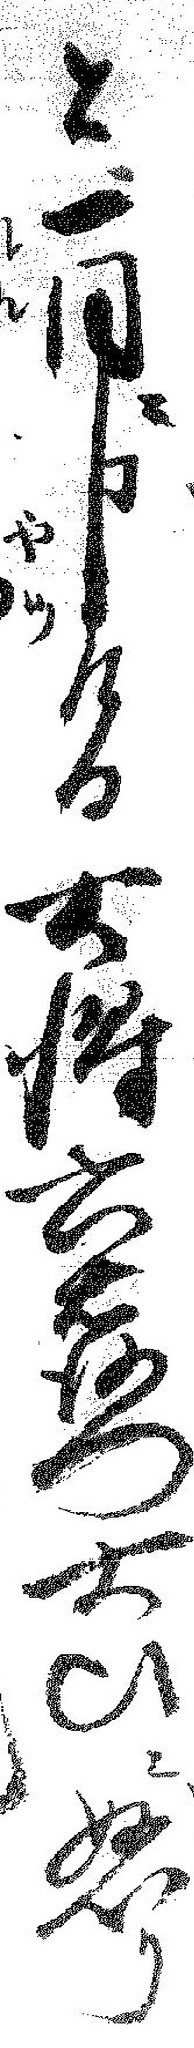と一同に申ける大将六右衛門大ひに怒り
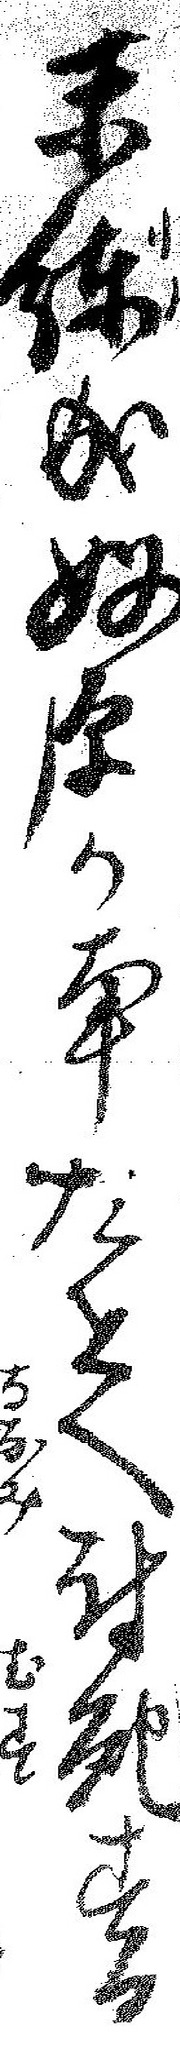未練成奴原かなたとへ討死する
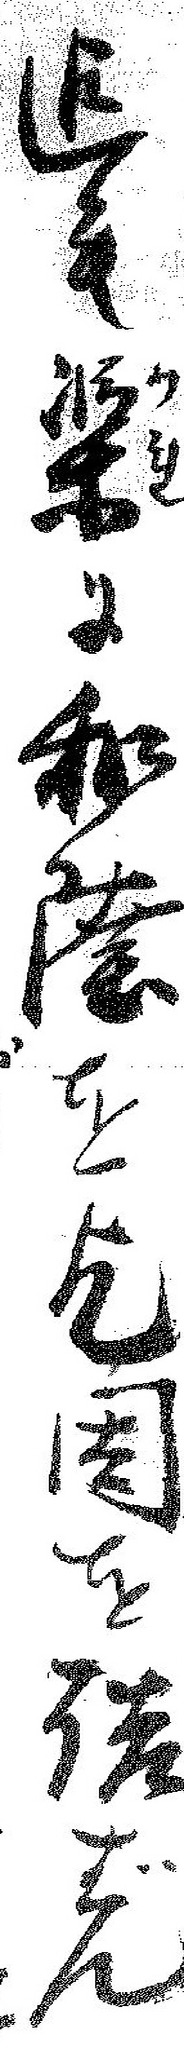迄も渠に和陸を乞因を結ばん
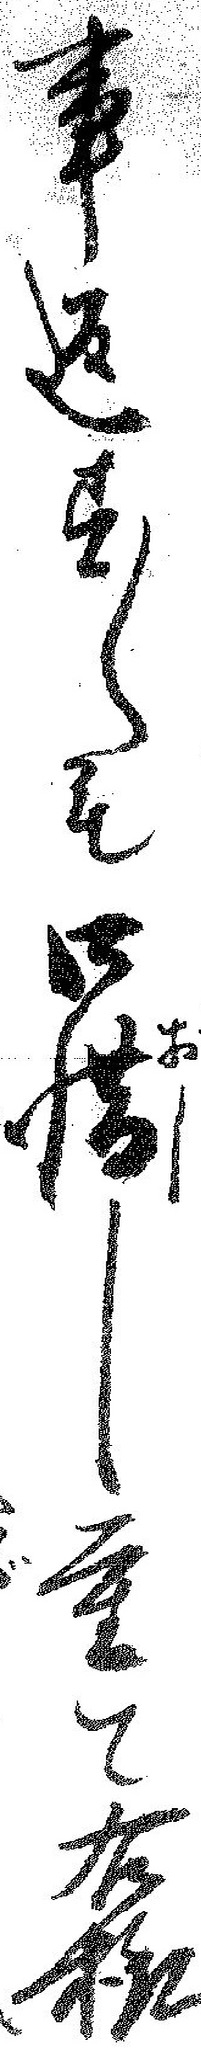事返す〳〵も口惜し重て右様
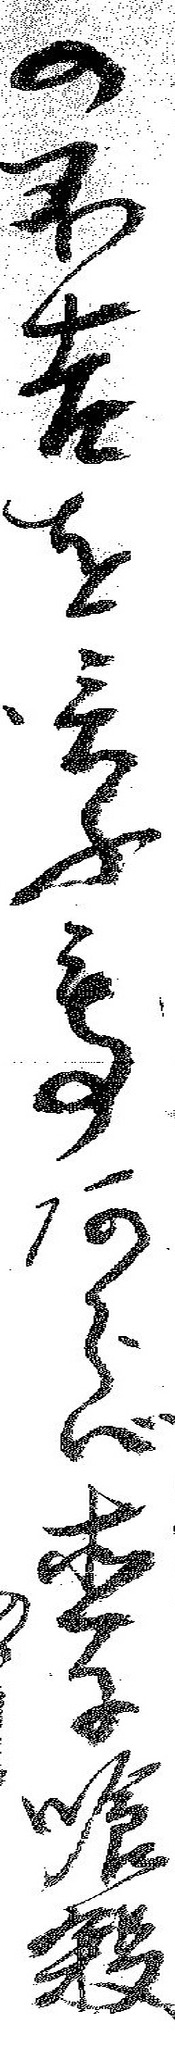の不吉を云ふものあらば直に喰殺
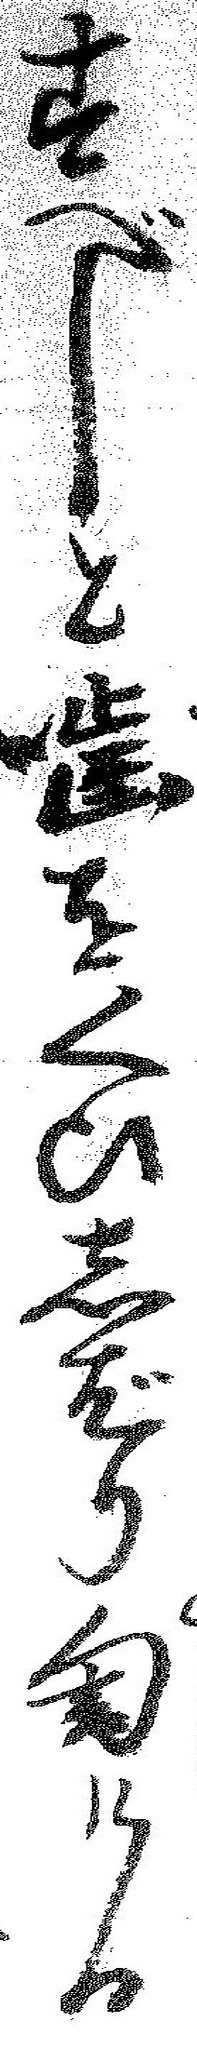すべしと歯をくひしばり訇ける
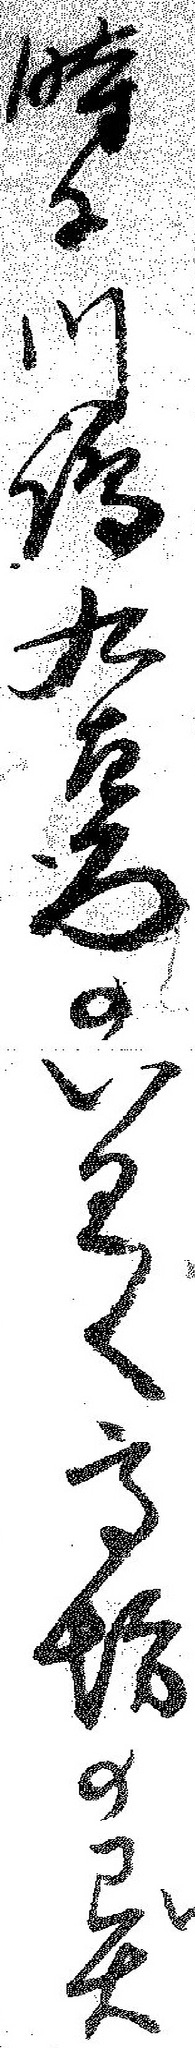時に川嶋九左衛門のいわく高坊の異
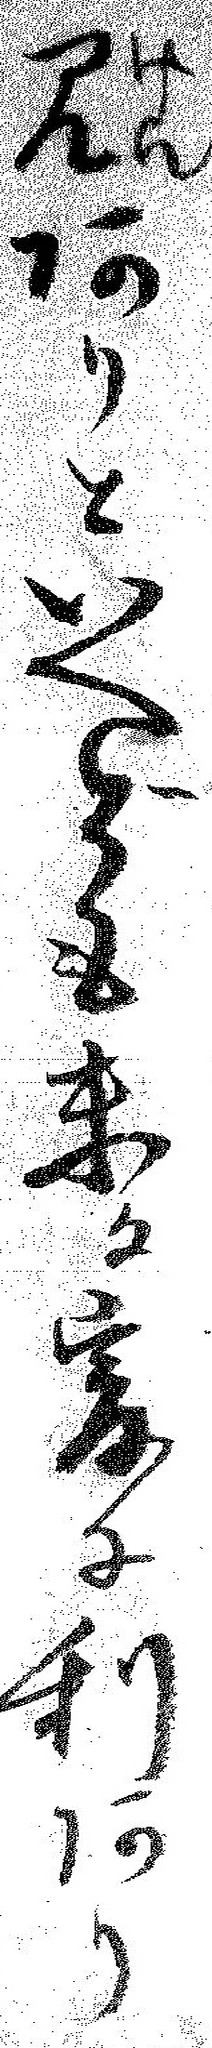見ありといへども未た爰に利あり

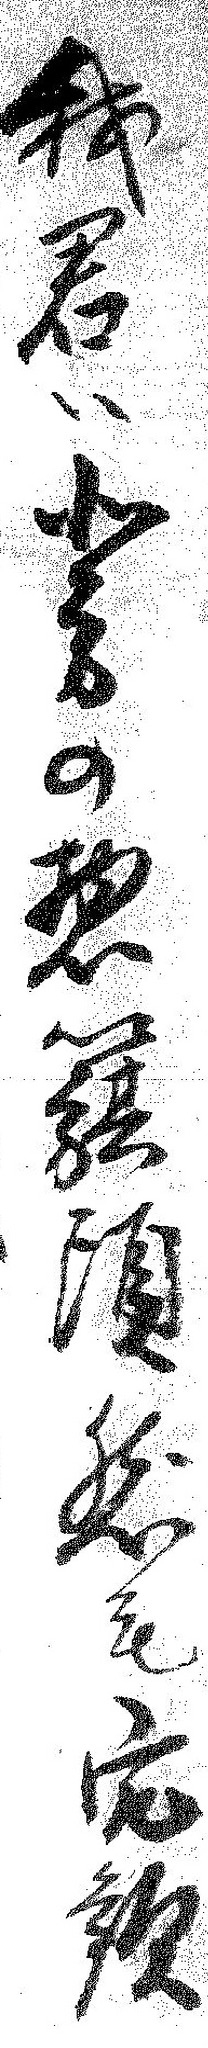我君は北方の惣籏頭然も穴観
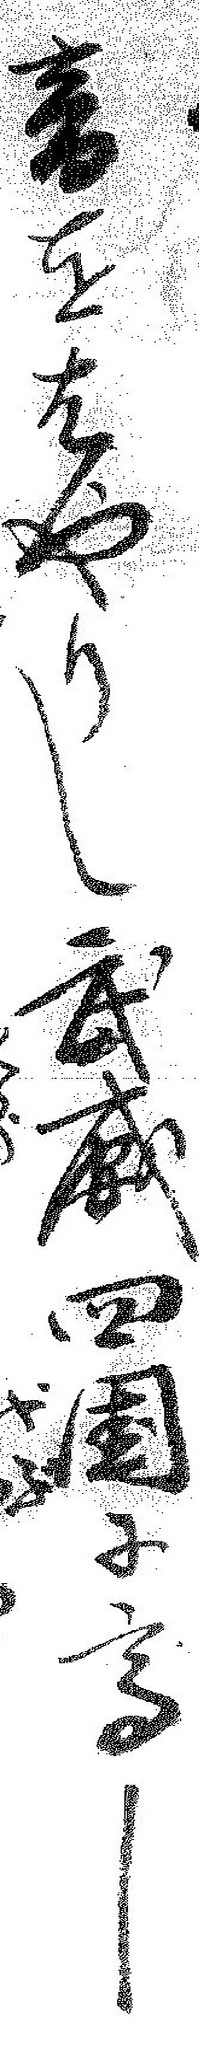音をはやりし武威四国に高し
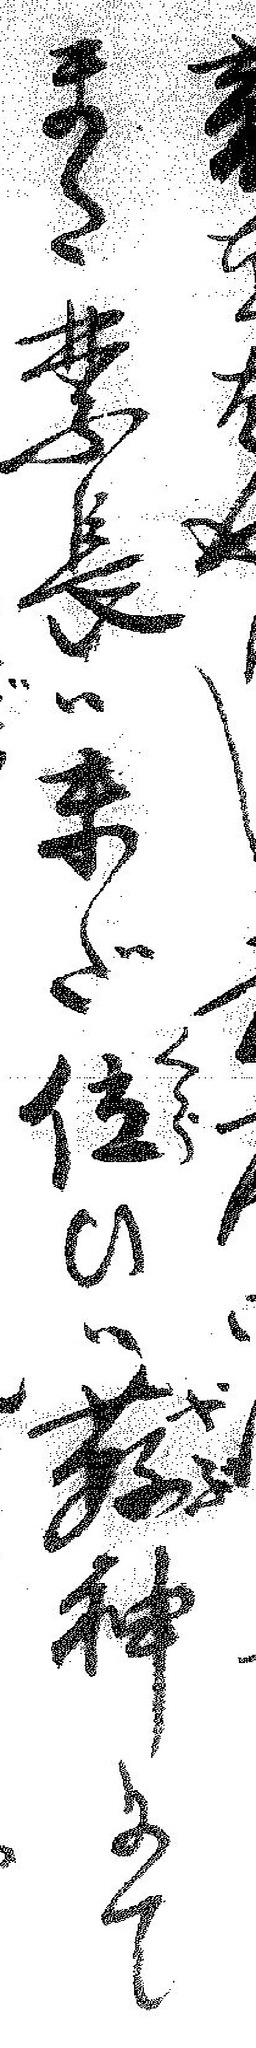また禁長は未だ位ひは藪神にて
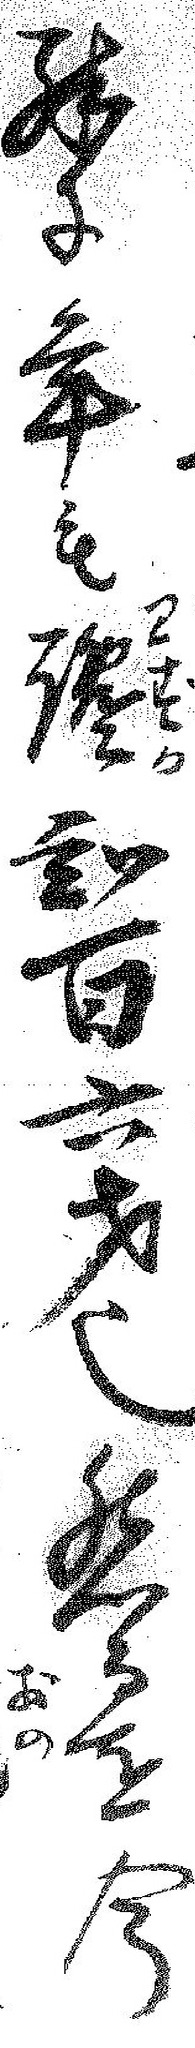殊に年も纔弐百六才也然るを今
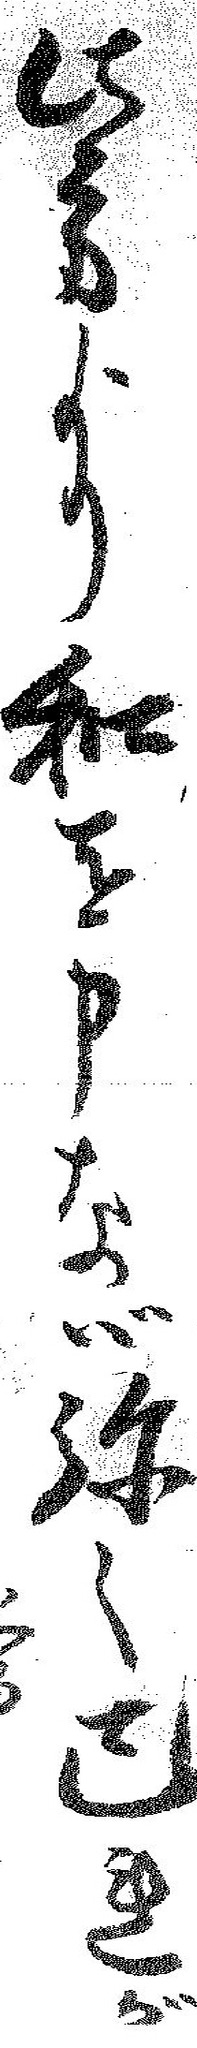此方より和を申なば弥〳〵己れが
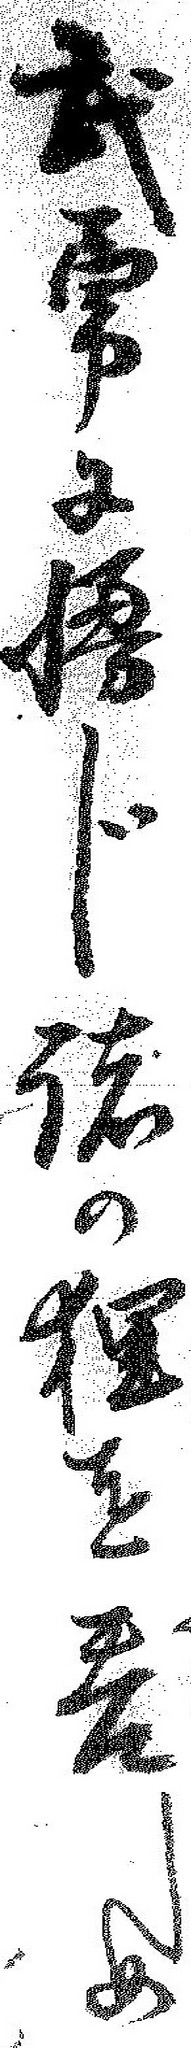武勇に慢じ諸の狸を苦しめ
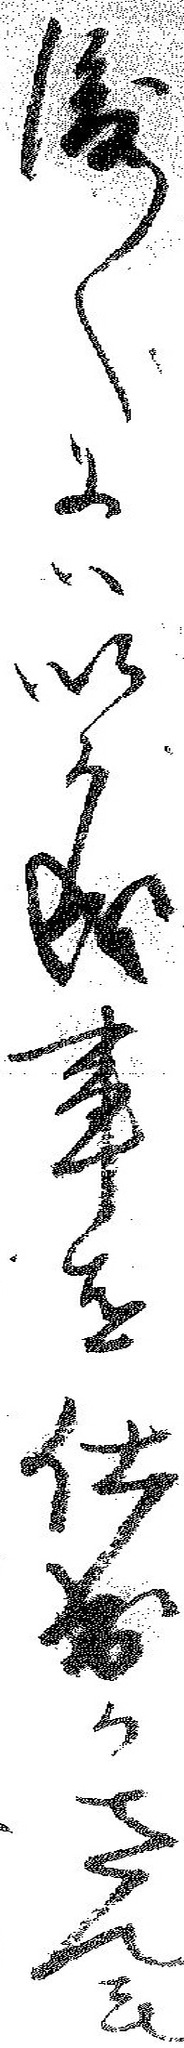後〳〵にはいか成事を仕出かさんも
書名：近頃古狸珍説　礼義智信
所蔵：徳島県立図書館
